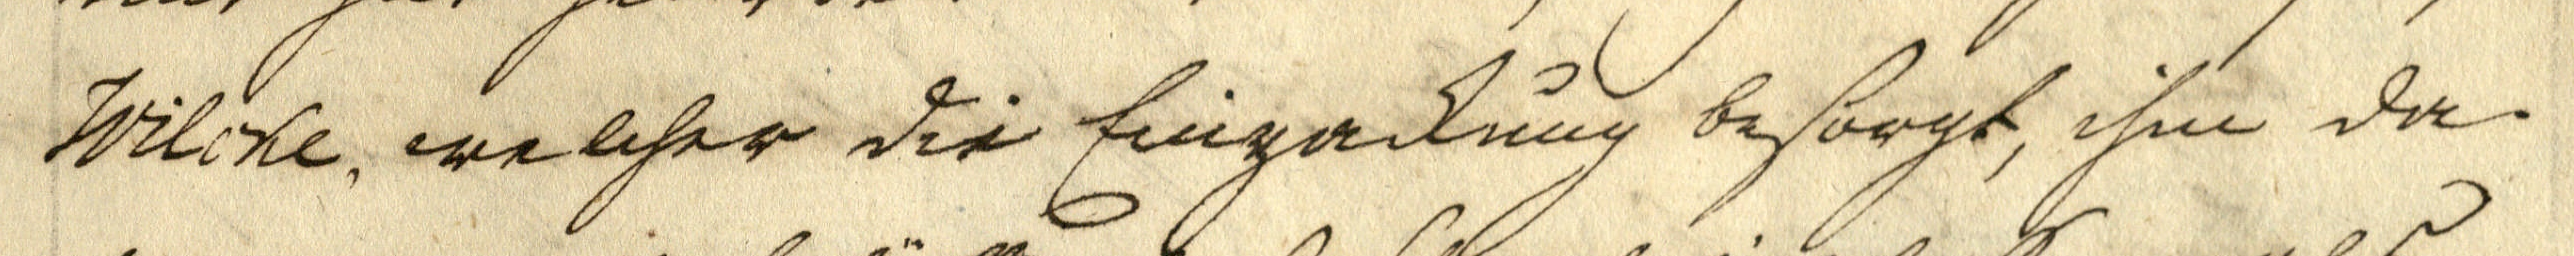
Wilcke, welcher die Einpackung besorgt, ihm da-
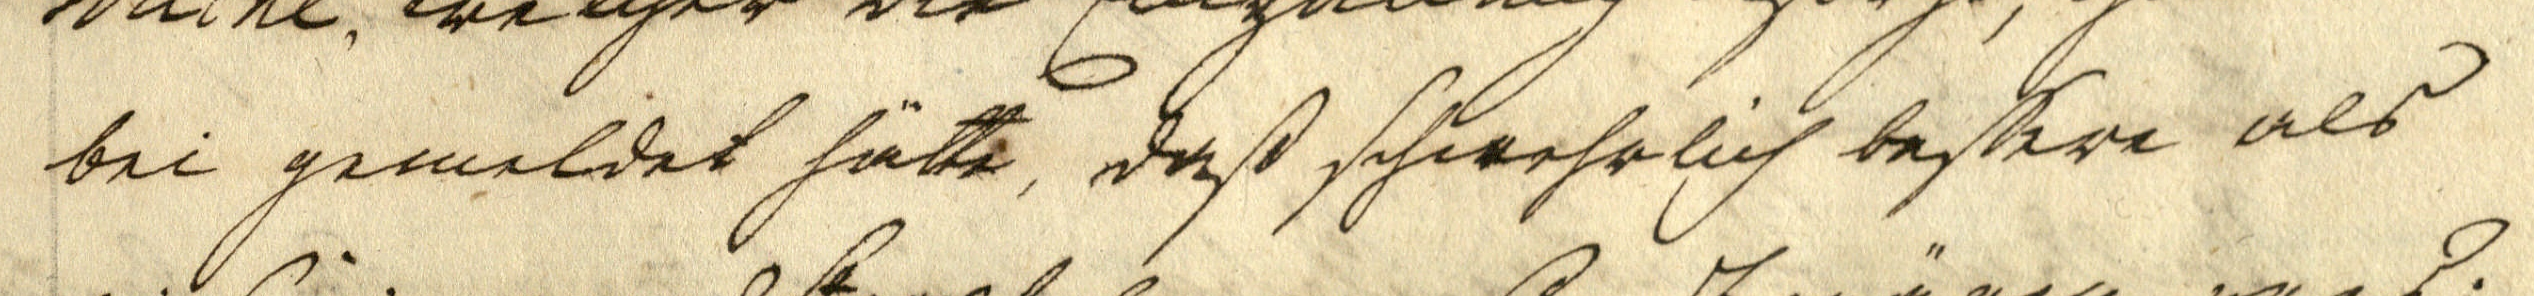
bei gemeldet hätte, daß schwerlich bessere als
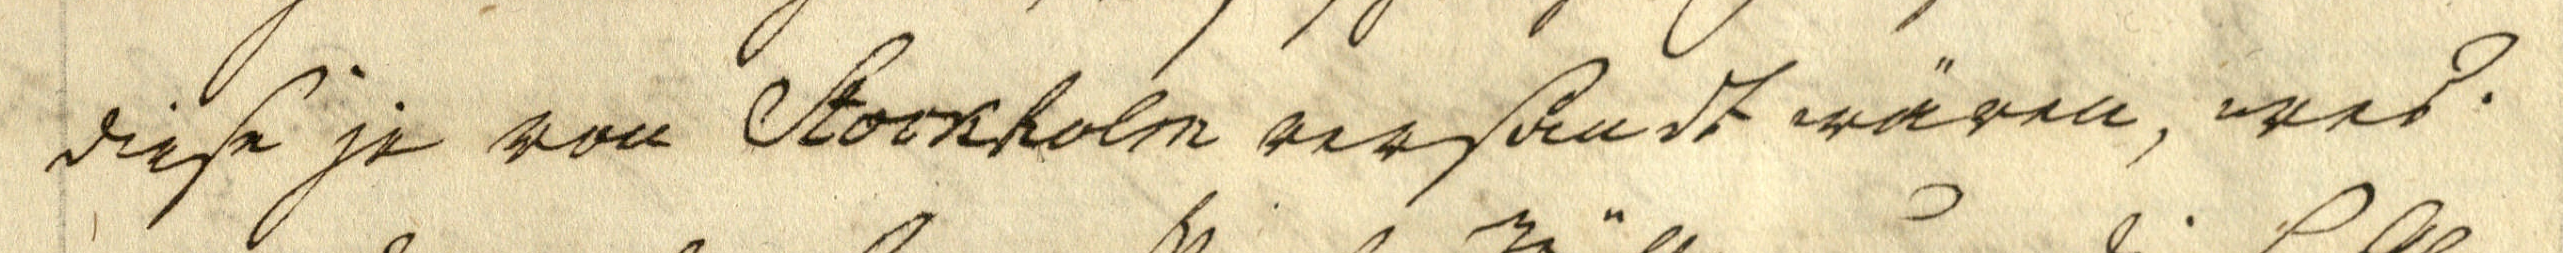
diese je von Stockholm versandt wären, wes-
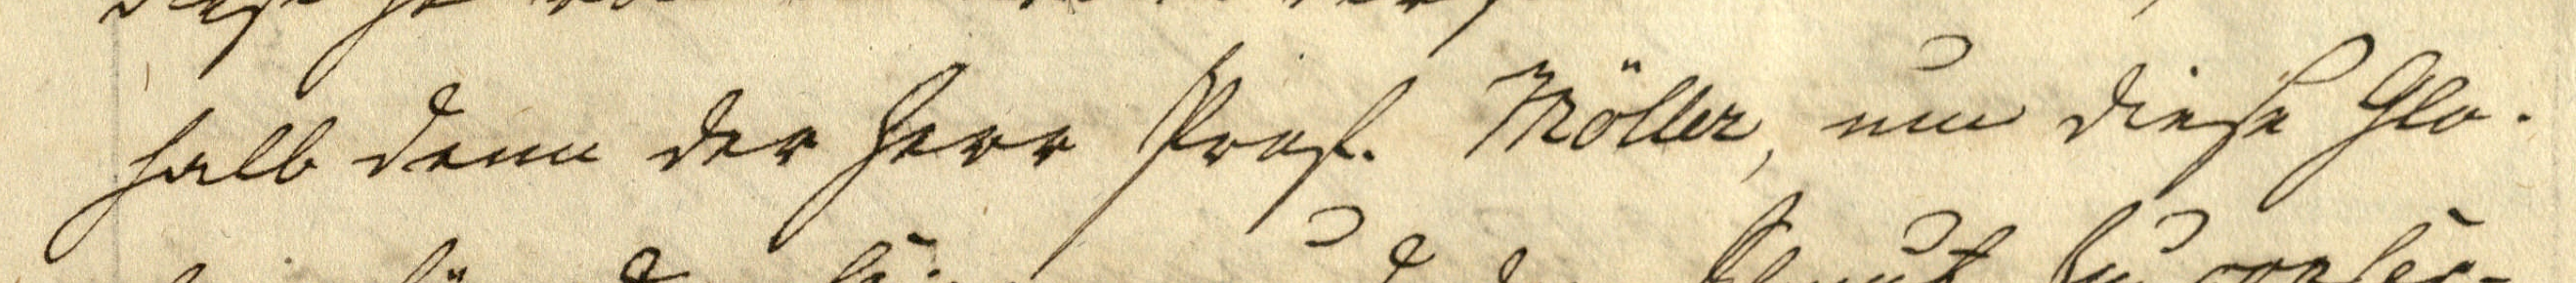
halb denn der Herr Prof. Möller, nun diese Glo-
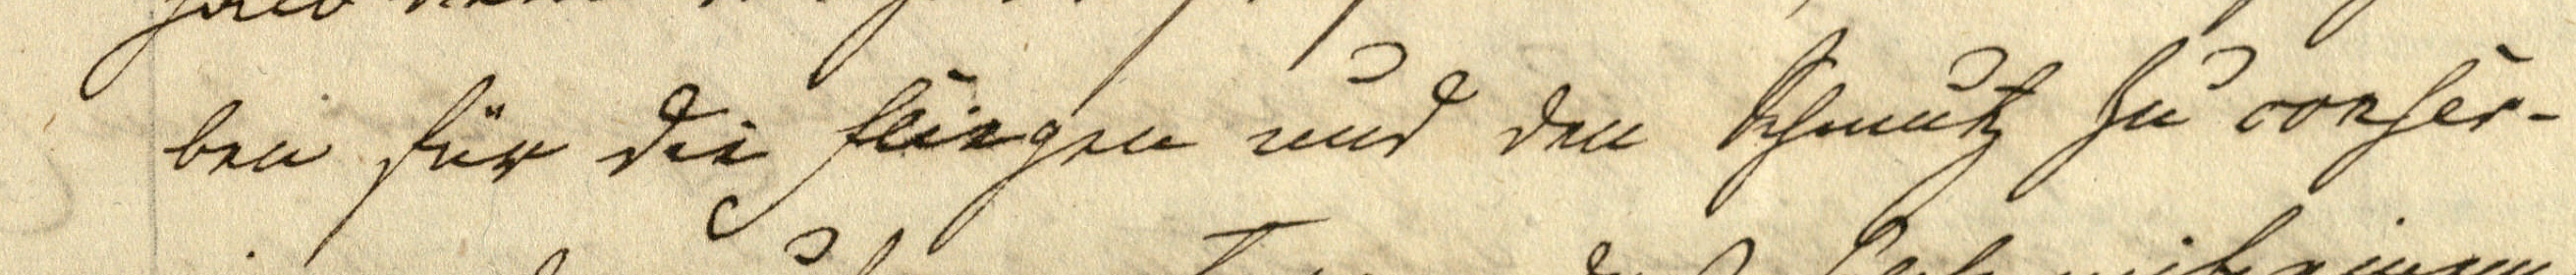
ben für die Fliegen und den Schmutz zu conser-
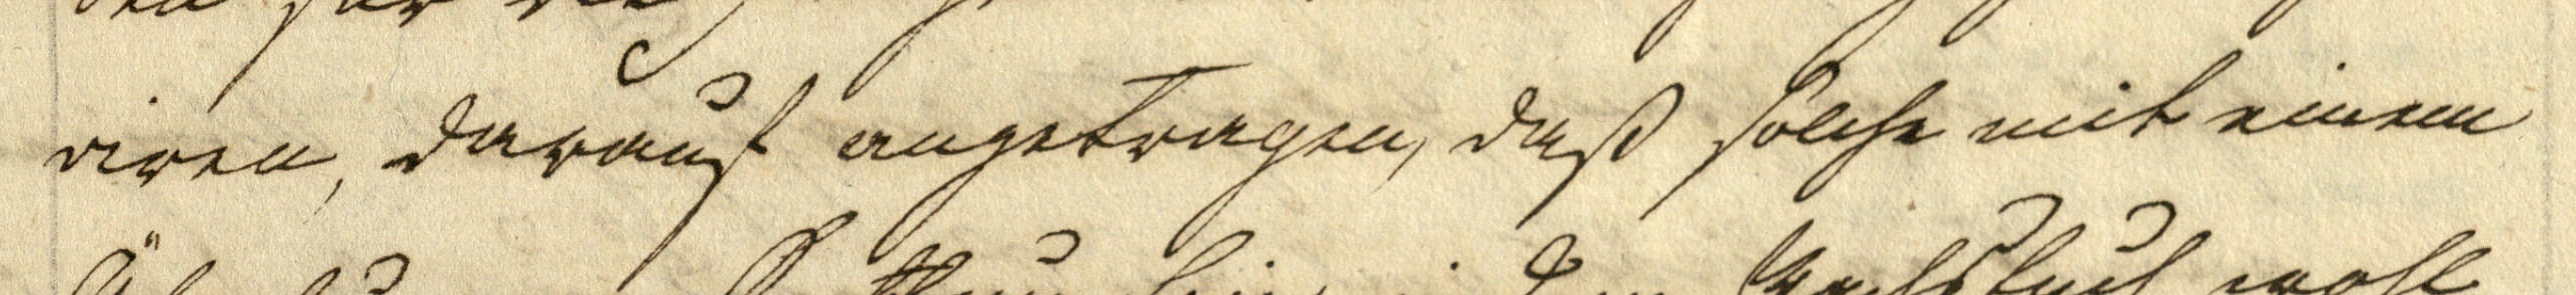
viren, darauf angetragen, daß solche mit einem
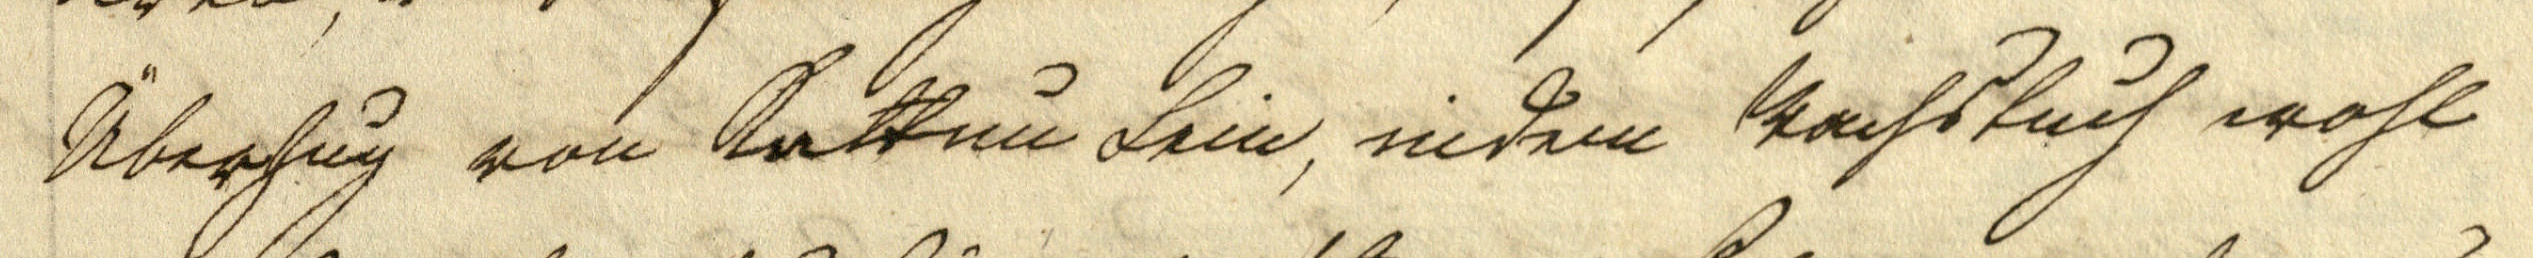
Überzug von Kattun Lein, indem Wachstuch wohl
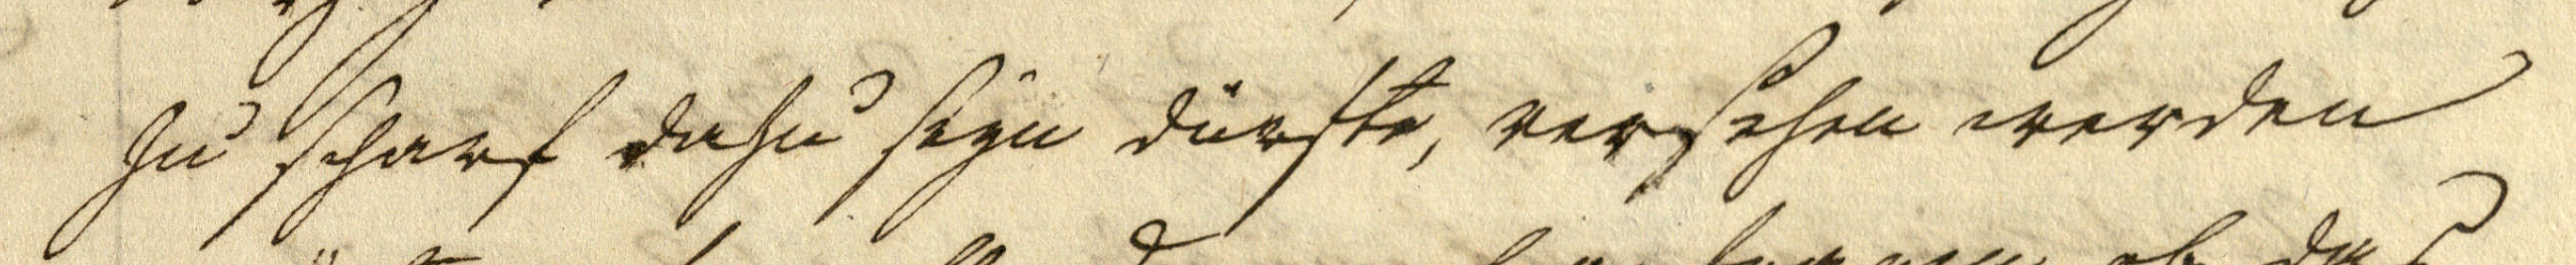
zu scharf dazu seyn dürfte, versehen werden
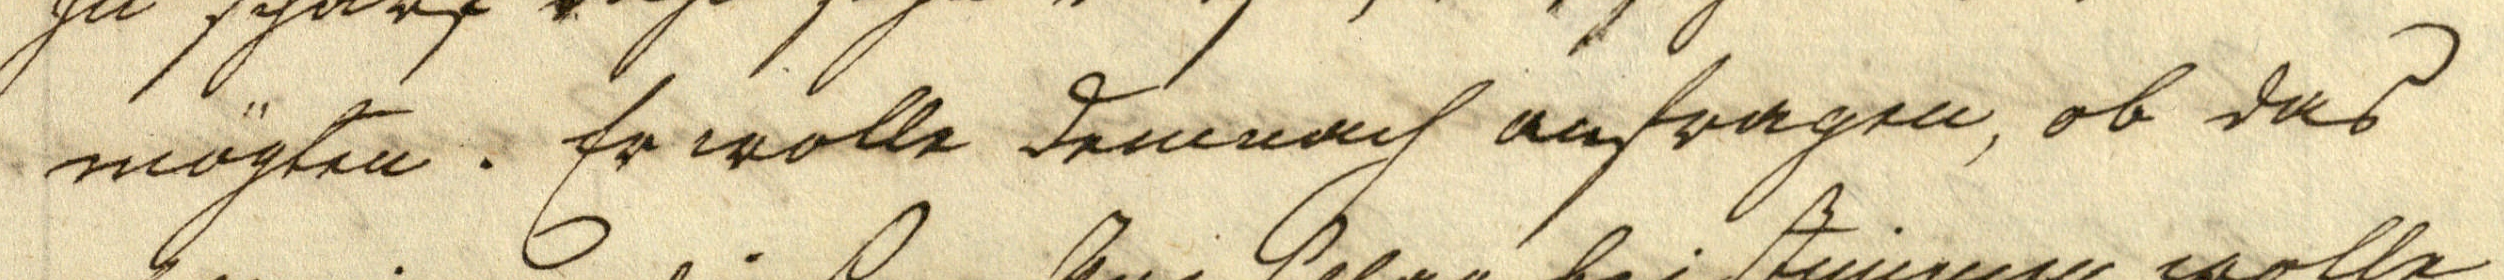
mögten. Er wolle demnach anfragen, ob das
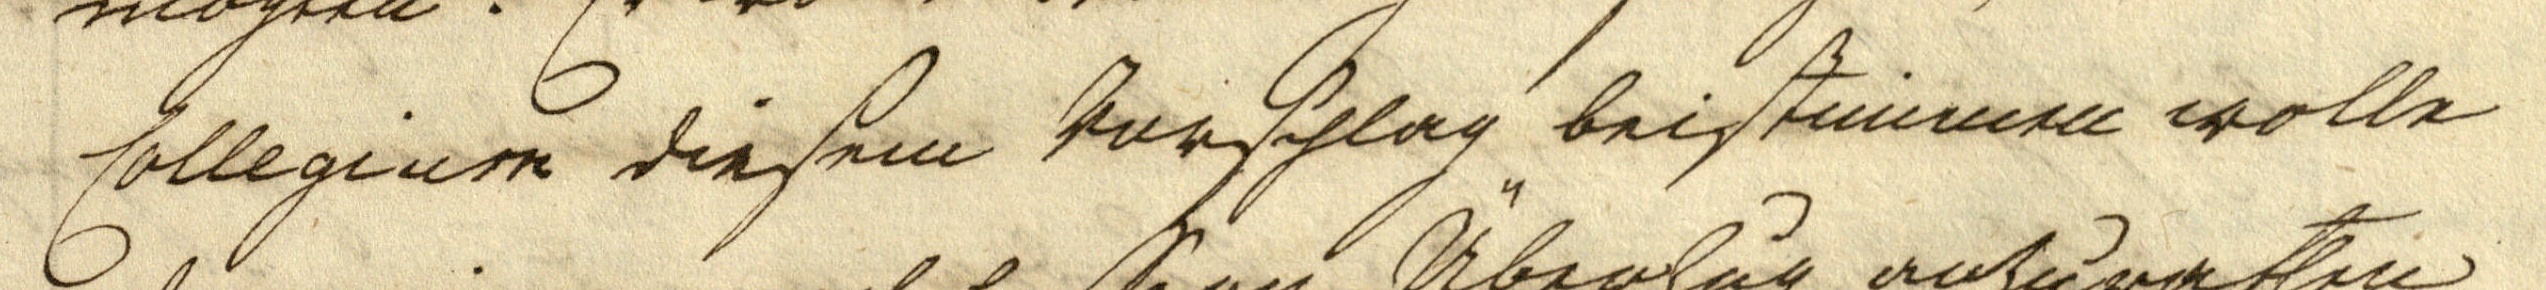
Collegium diesem Vorschlag beistimmen wolle
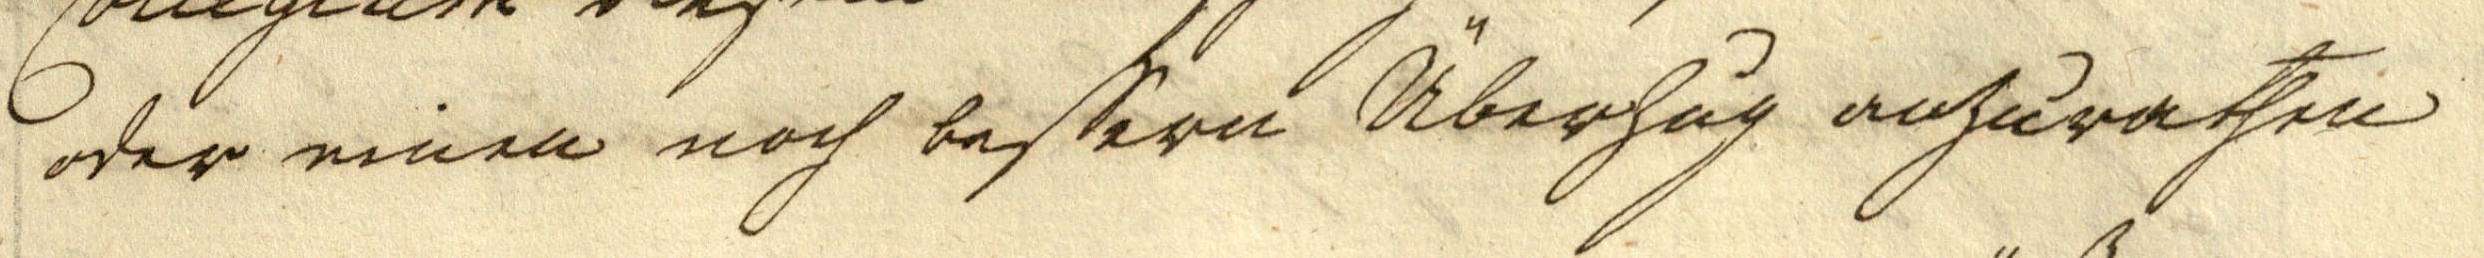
oder einen noch bessern Überzug anzurathen
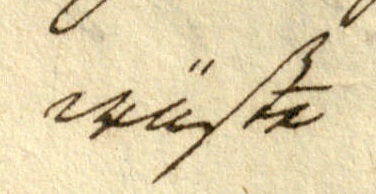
wüßte
